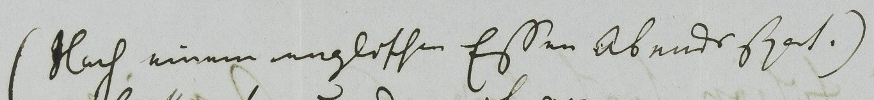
(Nach einem englischen Essen Abends spät.)
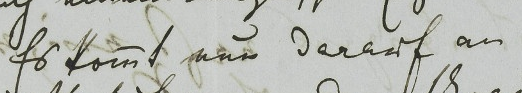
Es kommt nun darauf an
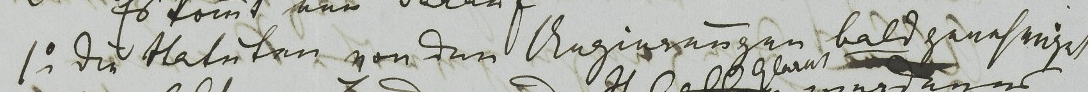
1o Die Statuten von den Regierungen bald genehmiget
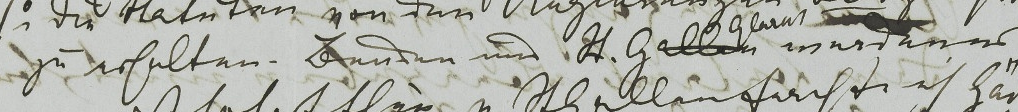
zu erhalten. Bünden und St. GallenGlarus werden es
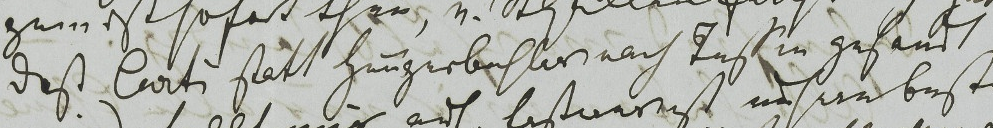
Daß Curti statt Hungerbühler nach Tessin gesandt
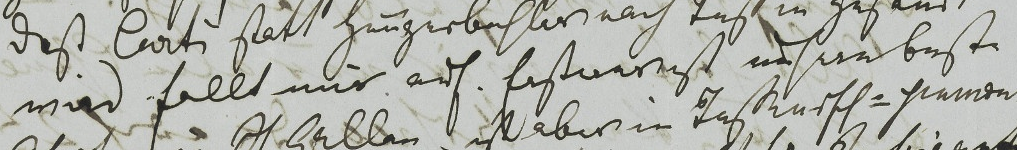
wird fällt mir auf. Ersterer ist unsere beste
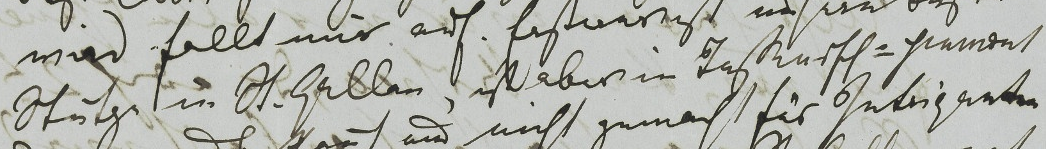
Stütze in St. Gallen, ist aber in Tessinisch-piemont.
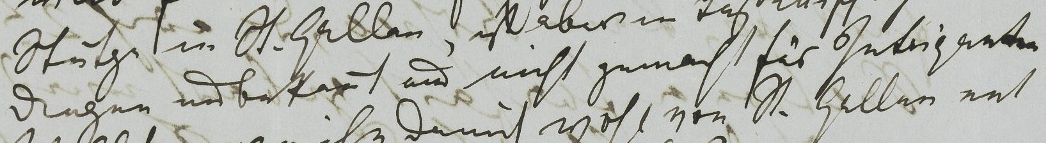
Dingen unbekannt und nicht gemacht für Intrigen.
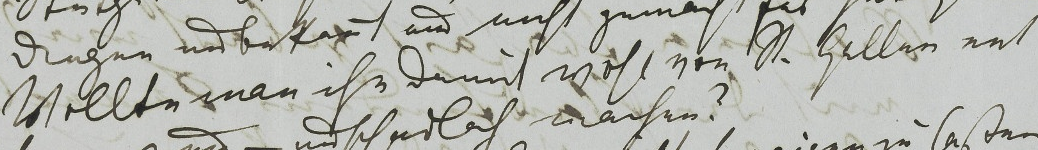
Wollte man ihn damit wohl von St. Gallen ent-
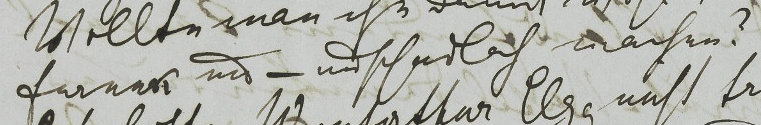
fernen und – unschädlich machen?
